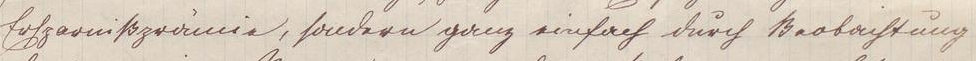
Ersparnißgrämie, sondern ganz einfach durch Beobachtung
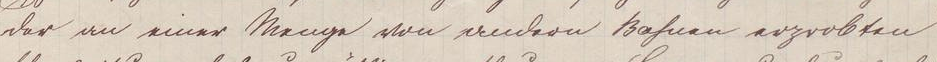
der an einer Menge von andern Bahnen erprobten
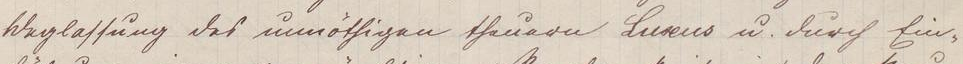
Weglassung des unnöthigen theuern Luxus u. durch Ein-
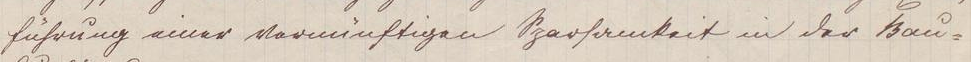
führung einer vernünftigen Sparsamkeit in der Bau-
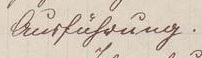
Ausführung.
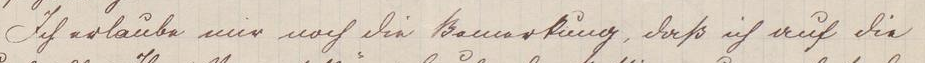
Ich erlaube mir noch die Bemerkung, daß ich auf die
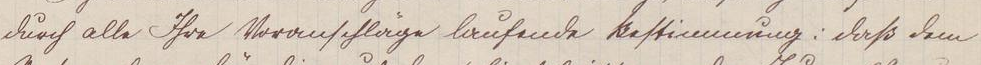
durch alle Ihre Voranschläge laufende Bestimmung: daß dem
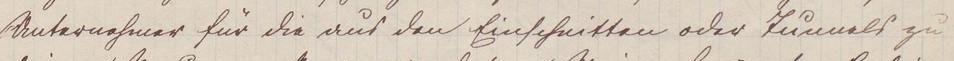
Unternehmer für die aus den Einschnitten oder Tunnels zu
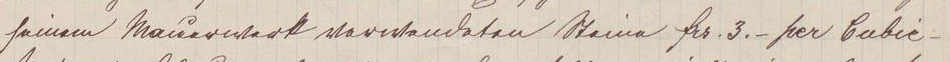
seinem Mauerwerk vorwendeten Steine frs. 3.– per Cubic-
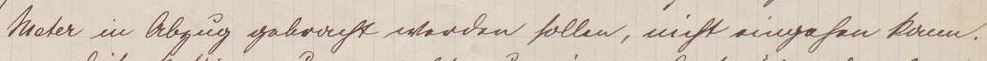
Meter in Abzug gebraucht werden sollen, nicht eingehen kann.
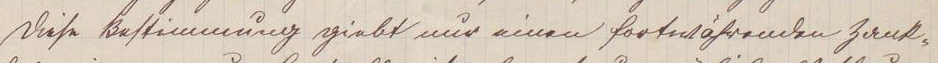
Diese Bestimmung giebt mir einen fortwährenden Zank-
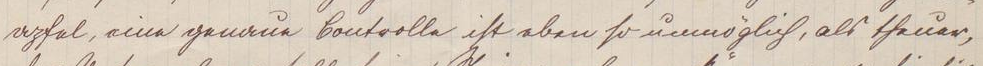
apfel, eine genaue Controlle ist eben so unmöglich, als theuer,
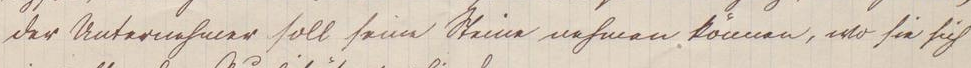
der Unternehmer soll seine Steine nehmen können, wo sie sich
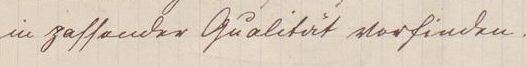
in passender Qualität vorfinden.
